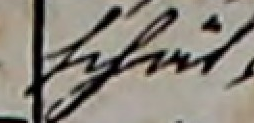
schät„
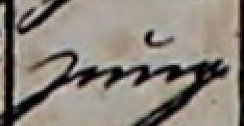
zung
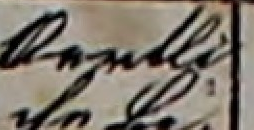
Oertli„
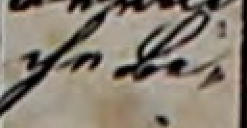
che Be„
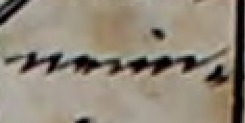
nenn„
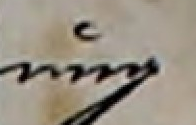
ung
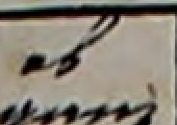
ob
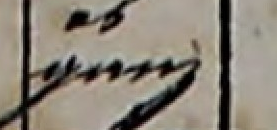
ganz
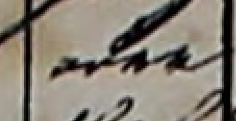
oder
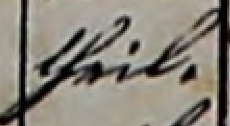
theil„
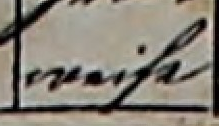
weise
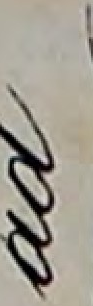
ad
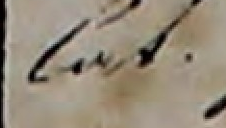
Cat.
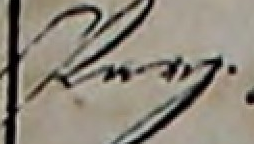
Parz.
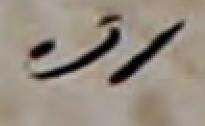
31
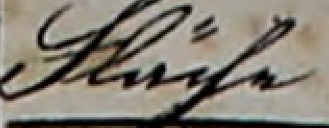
Fläche
